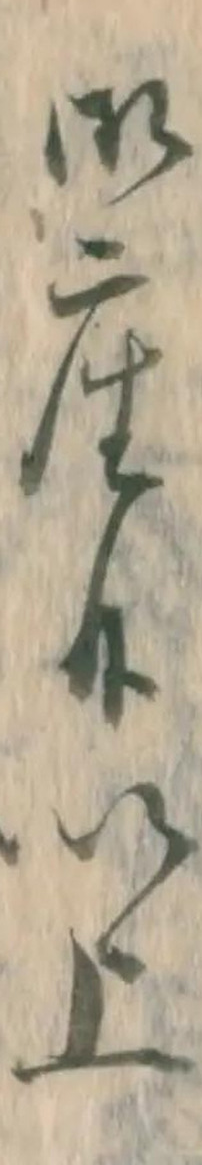御座候以上
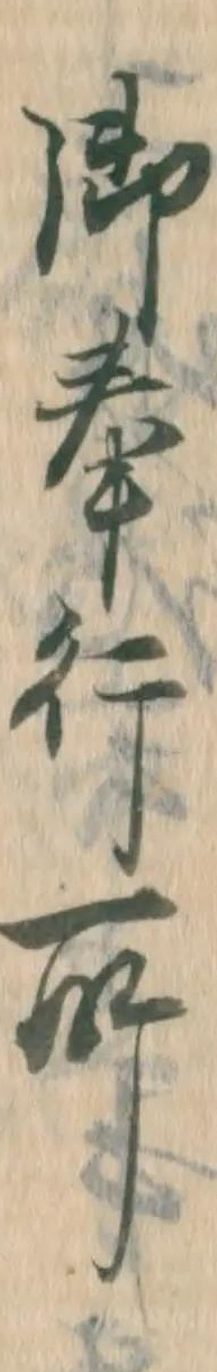御奉行所
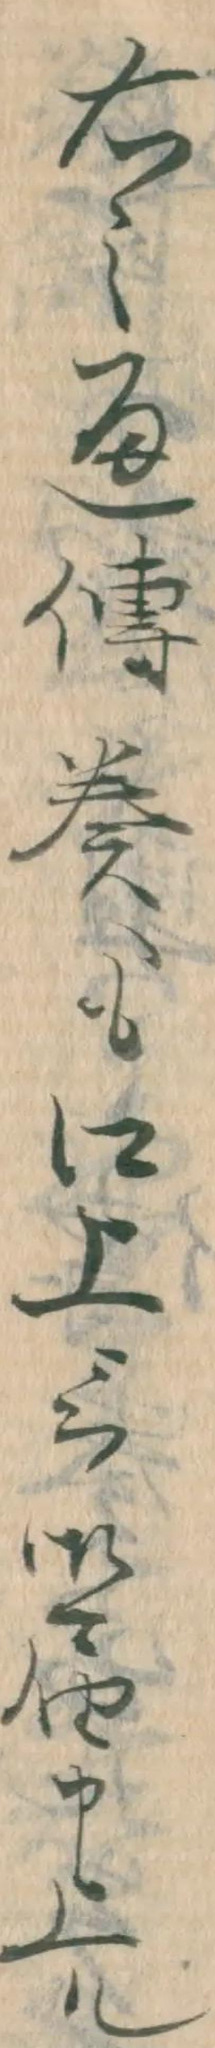右之通伝奏へも口上ニ而御届申上ル
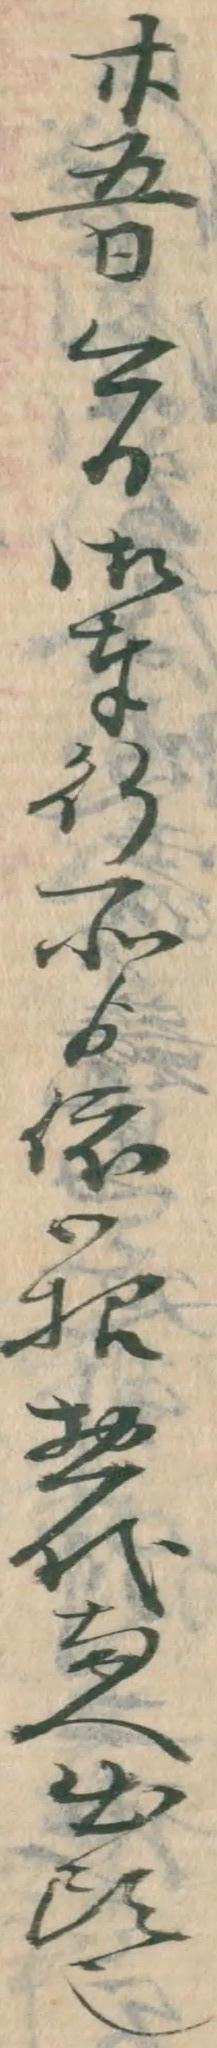廿五日今日御奉行所ゟ依御様惣代両人出頭也
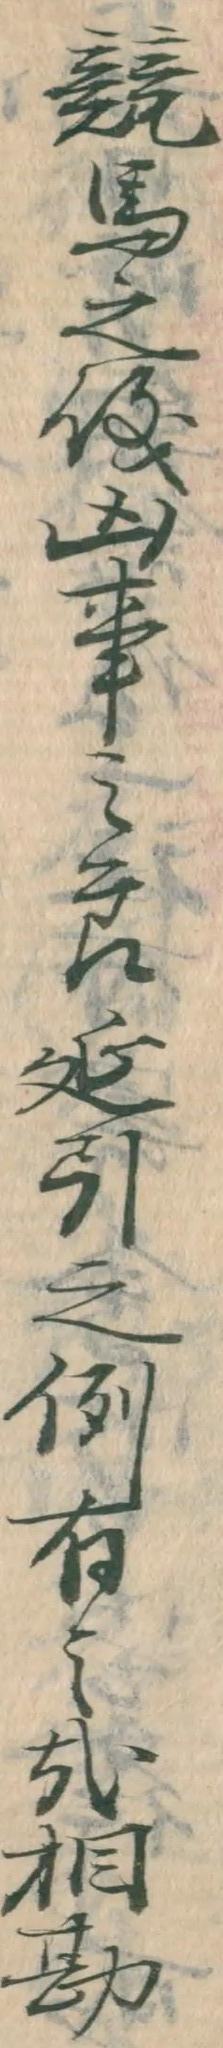競馬之儀凶事之節延引之例有之哉相勘
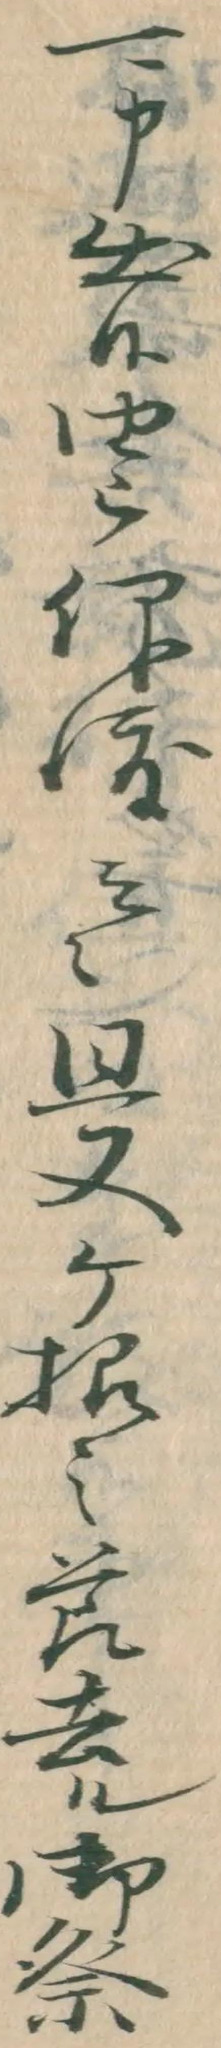可申出候由被仰渡云々且又ケ様之節去ル御祭
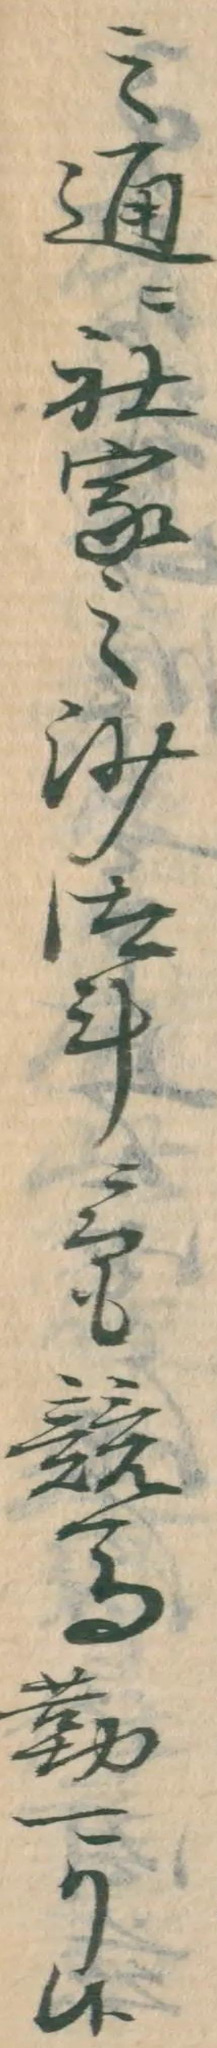之通ニ社家之沙汰計ニ而も競馬勤可申候

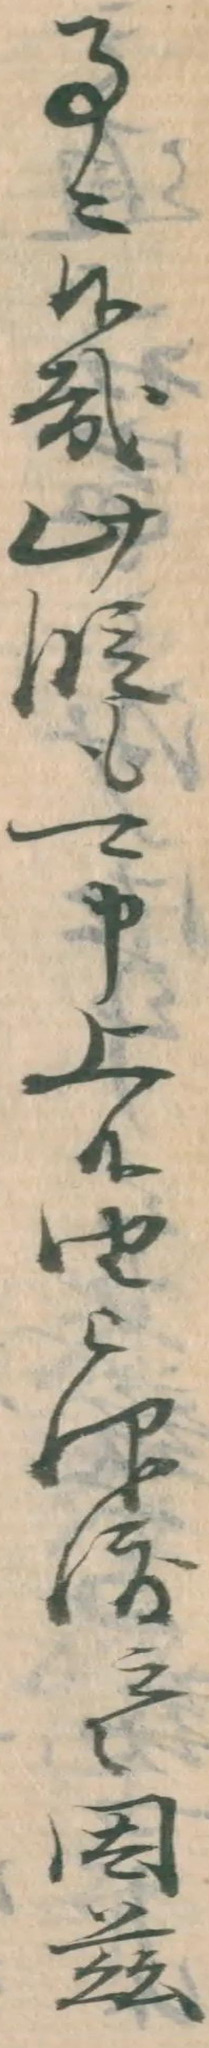事ニ候哉此段も可申上候由被仰渡云々因茲
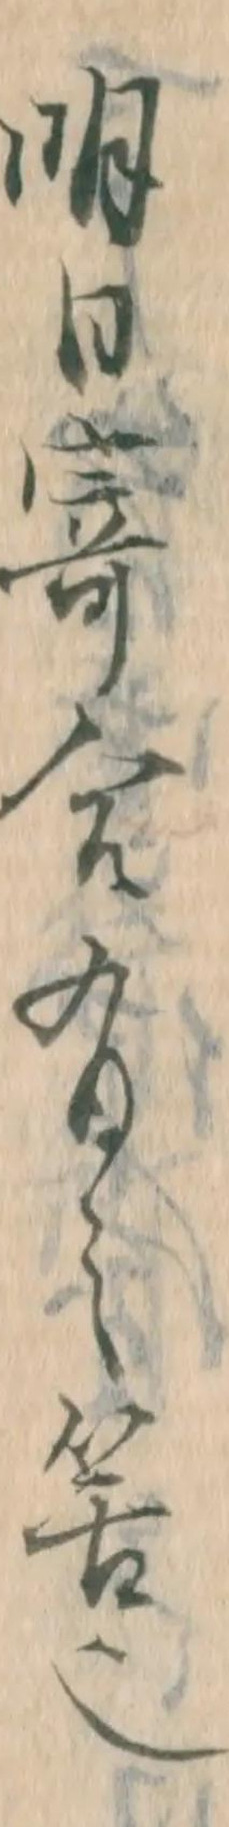明日寄合有之筈也
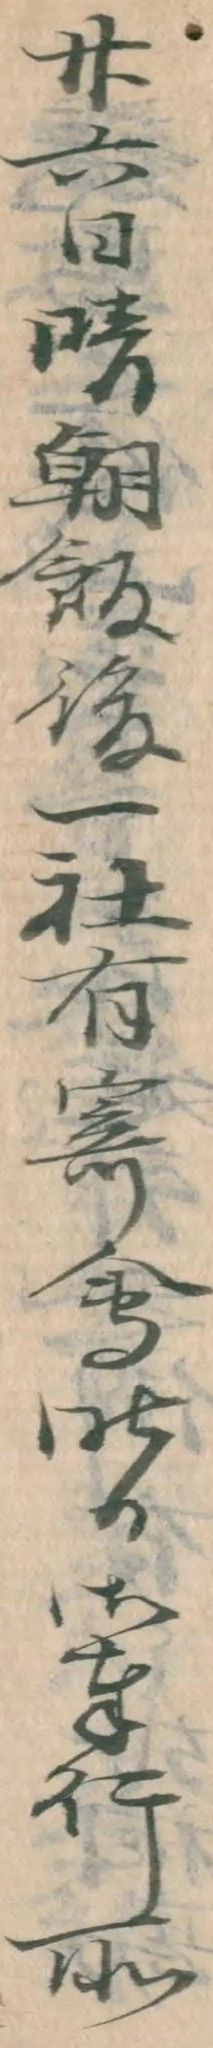廿六日晴朝飯後一社有寄会昨日御奉行所
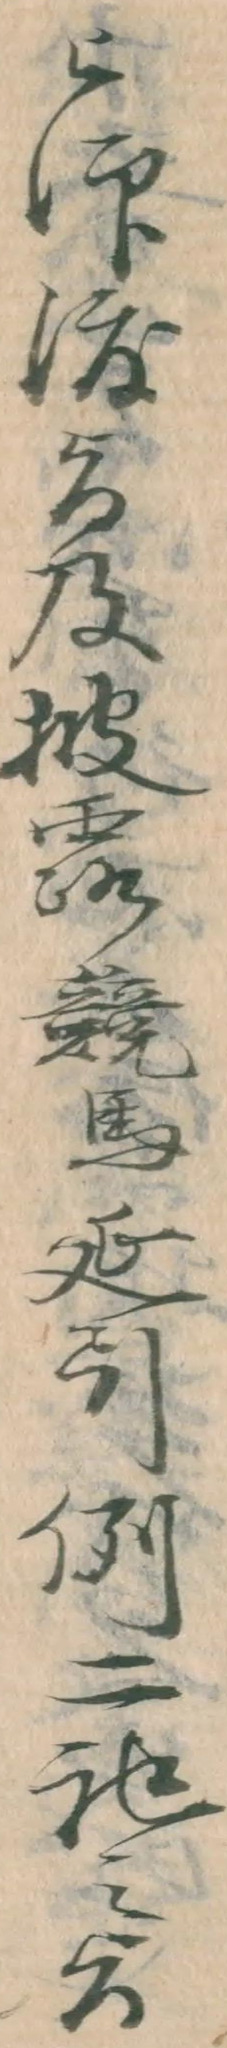被仰渡旨及披露競馬延引例二記之旨
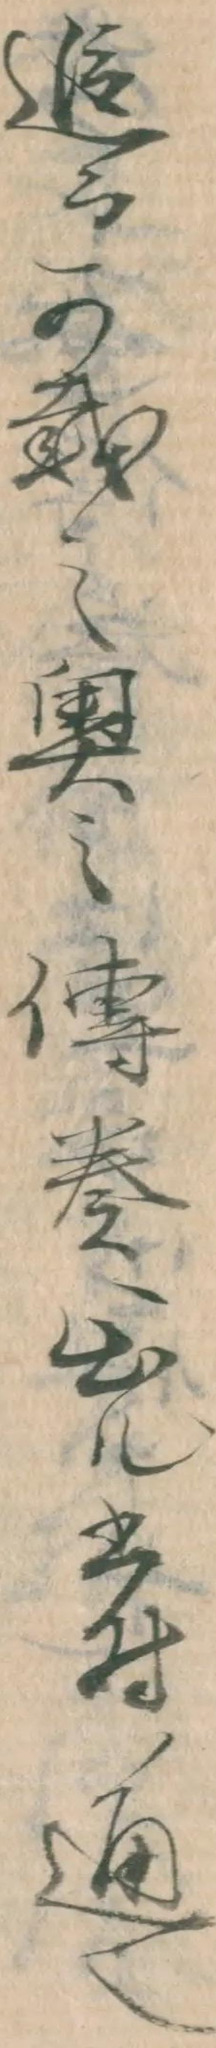追而可戴之奥之伝奏へ出ル書付ノ通也
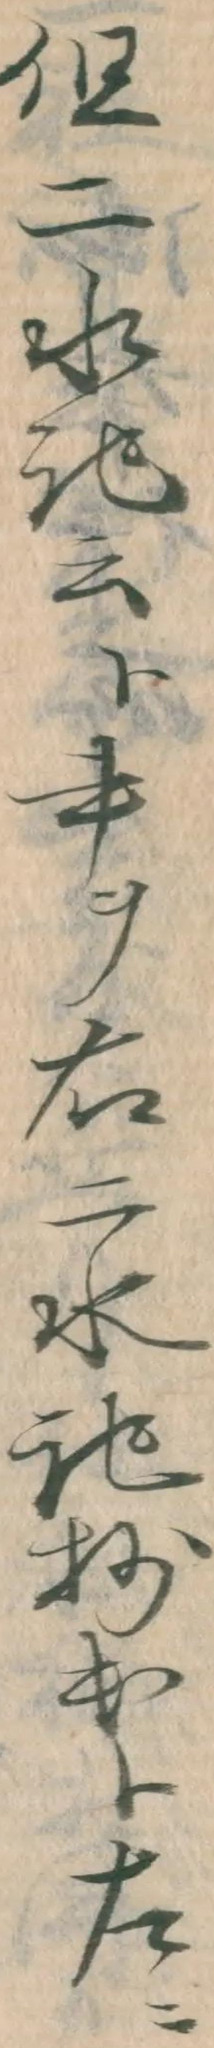但二水記云ト書ヲ右ニ水記抄本ト左ニ
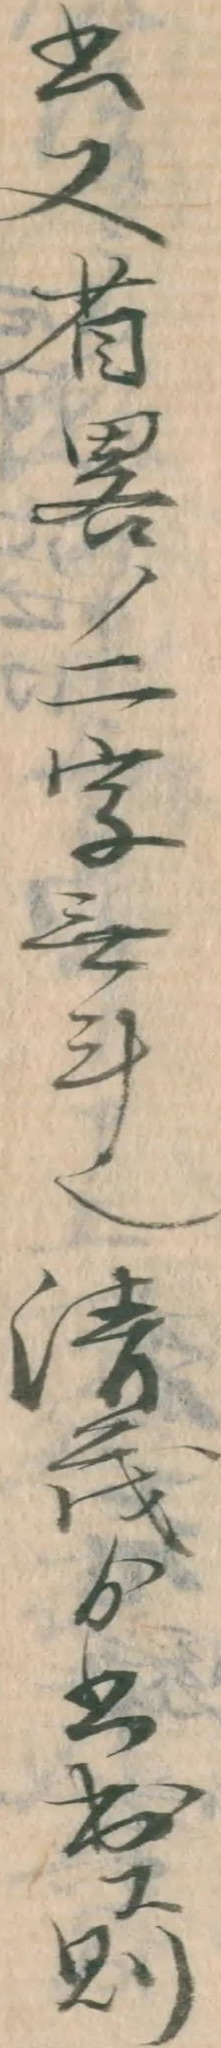書又省略ノ二字無計也清茂ゟ書出ス則
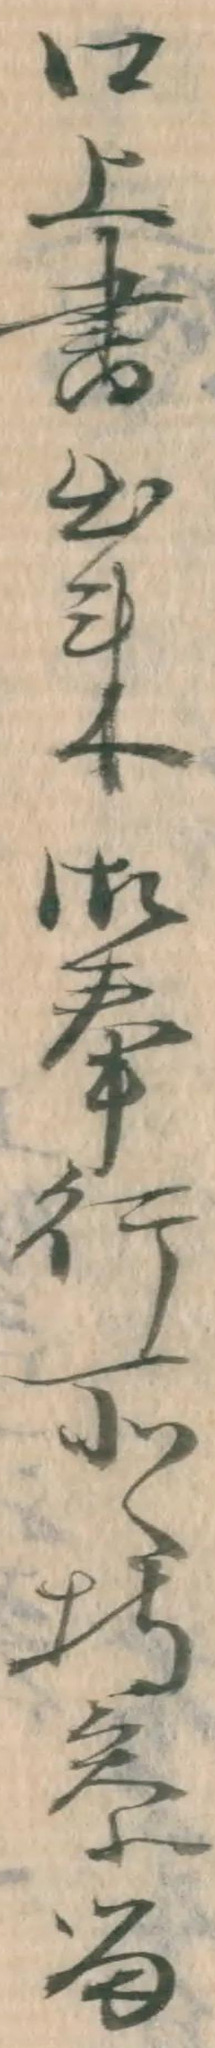口上書出来御奉行所へ持参留
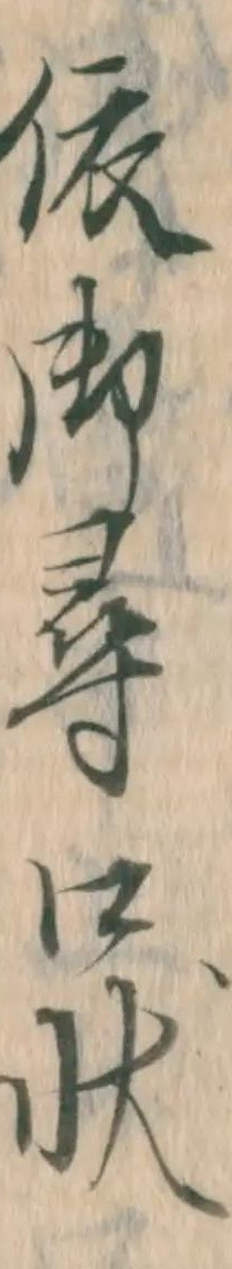依御尋口状
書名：賀茂社記録. 第10冊
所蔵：国立国会図書館 National Diet Library, JAPAN
